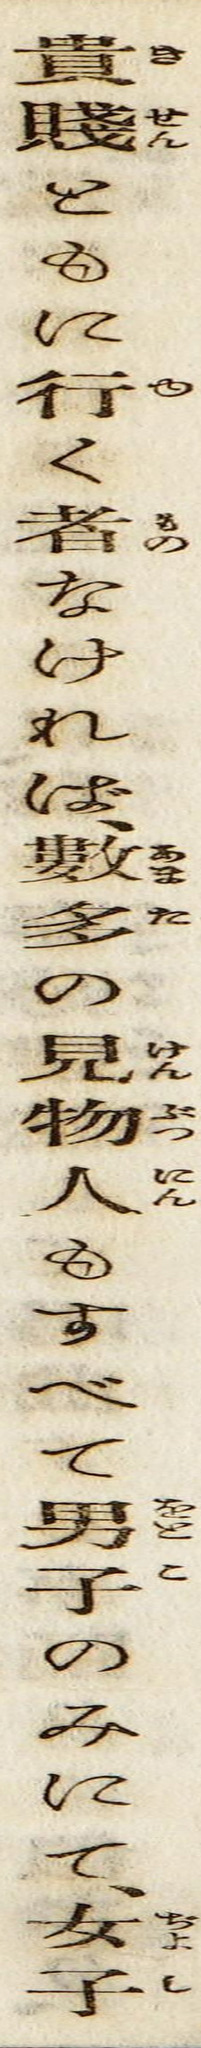貴賤ともに行く者なければ、数多の見物人もすべて男子のみにて、女子
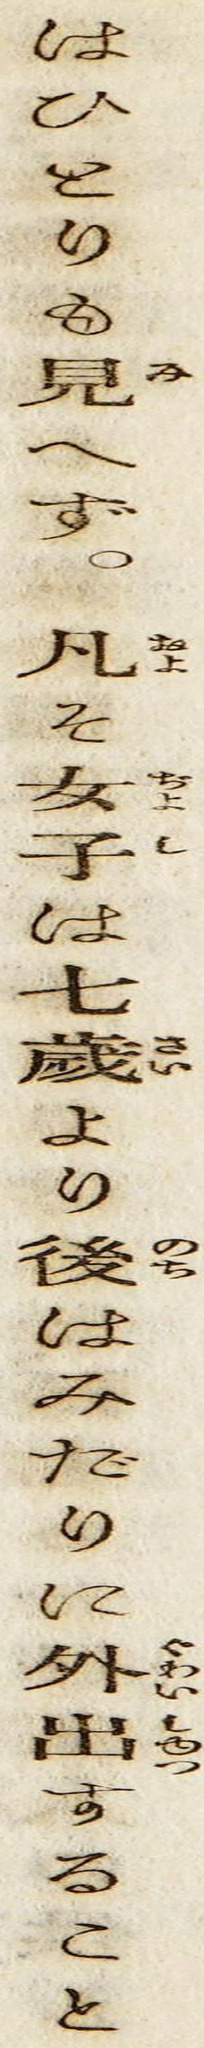はひとりも見へず。凡そ女子は七歳より後はみだりに外出すること
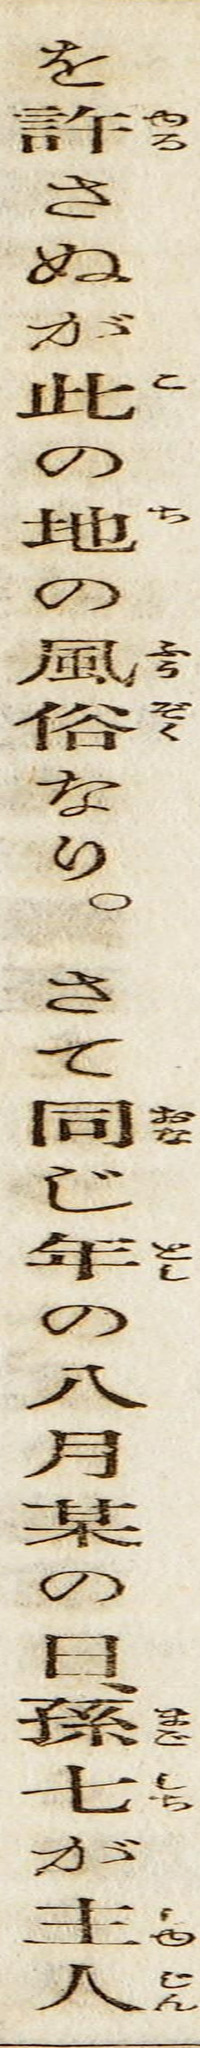を許さぬが此の地の風俗なり。さて同じ年の八月某の日、孫七が主人
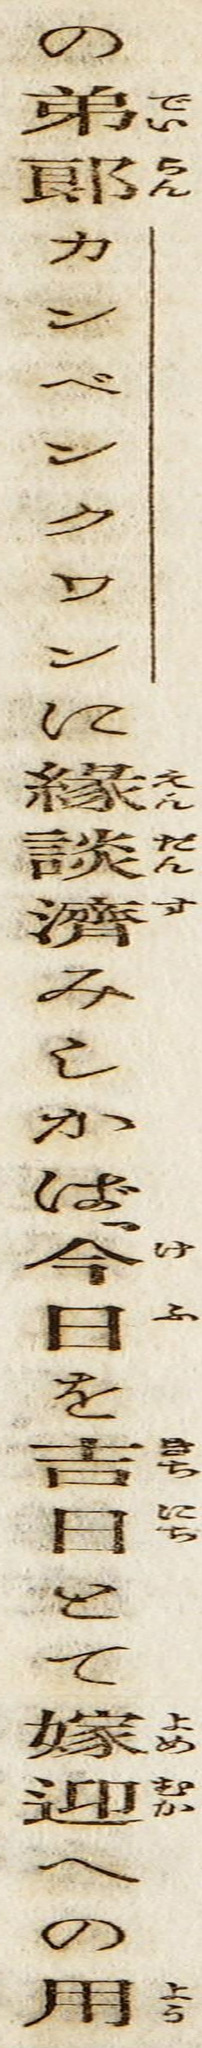の弟郎カンベンクワンに縁談済みしかば、今日を吉日とて嫁迎への用
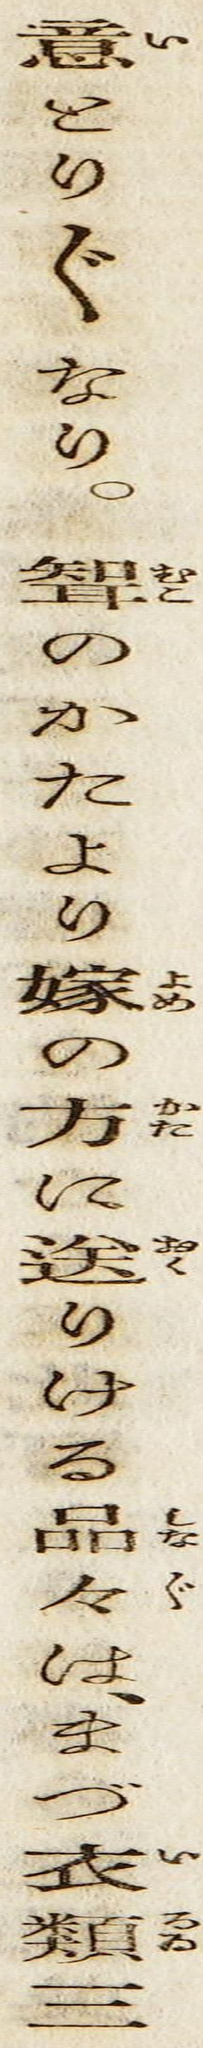意とり〴〵なり。婿のかたより嫁の方に送りける品々は、まづ衣類三
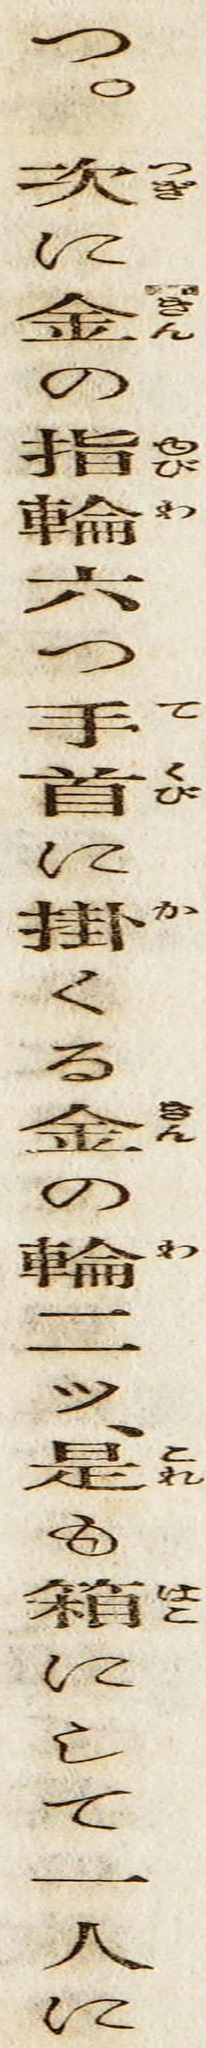つ。次に金の指輪六つ手首に掛くる金の輪二ツ、是も箱にして一人に
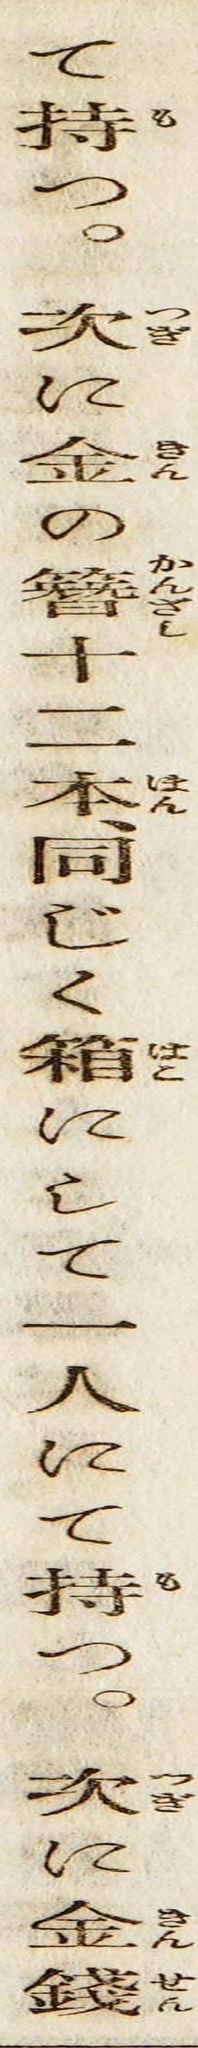て持つ。次に金の簪十二本、同じく箱にして一人にて持つ。次に金銭
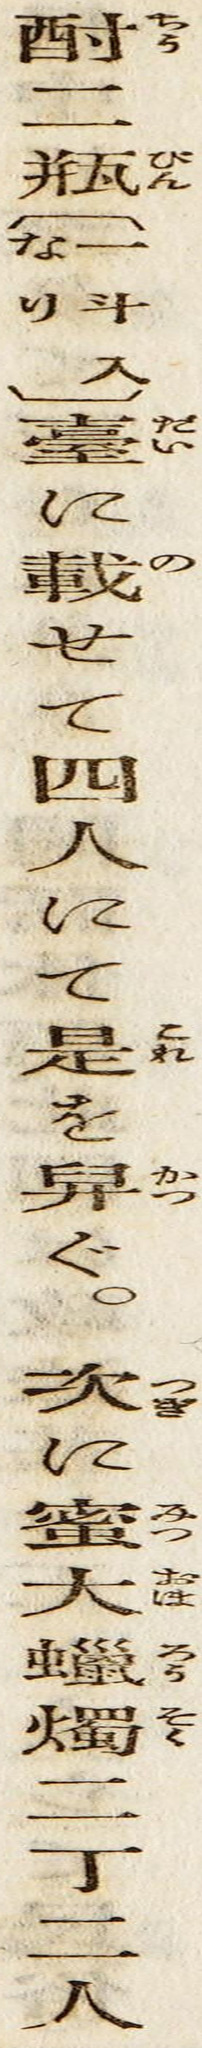酎二瓶[一斗入なり]台に載せて四人にて是を舁ぐ。次に蜜大蝋燭二丁二人
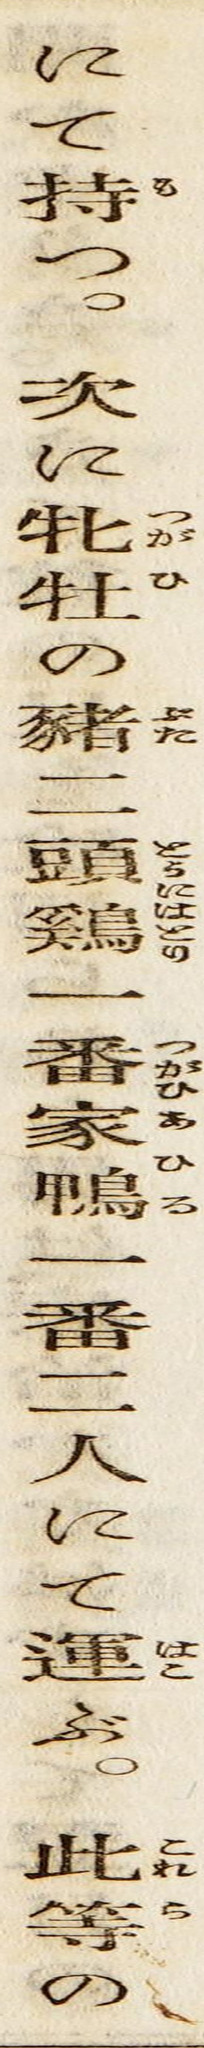にて持つ。次に牝牡の猪二頭鶏一番家鴨一番二人にて運ぶ。此等の
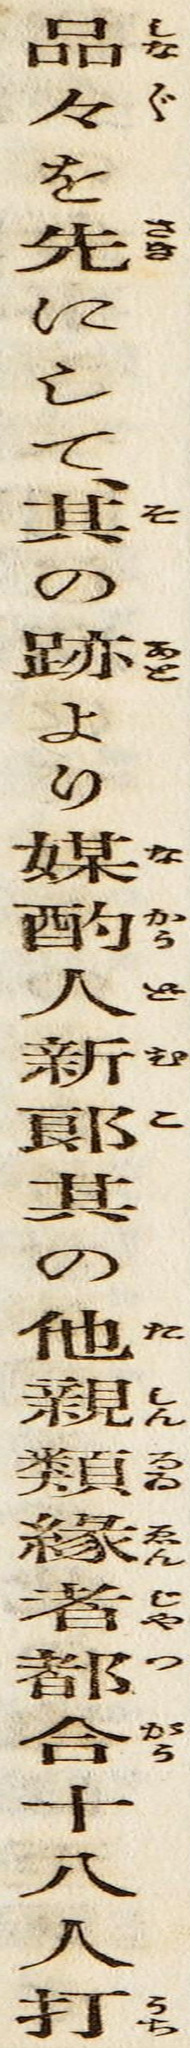品々を先にして、其の跡より媒酌人新郎其の他親類縁者都合十八人打
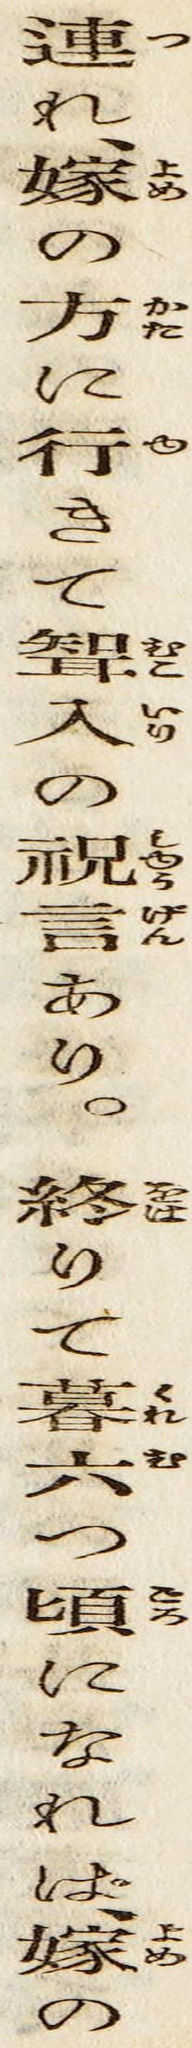連れ、嫁の方に行きて婿入の祝言あり。終りて暮六つ頃になれば、嫁の
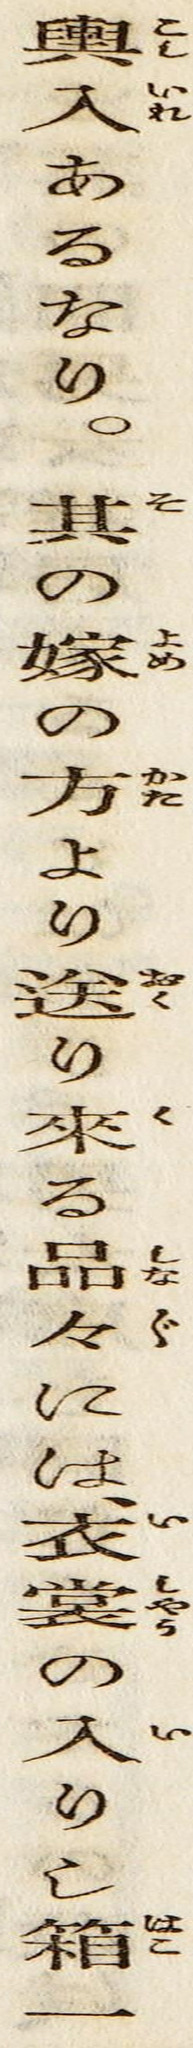輿入あるなり。其の嫁の方より送り来る品々には、衣裳の入りし箱一
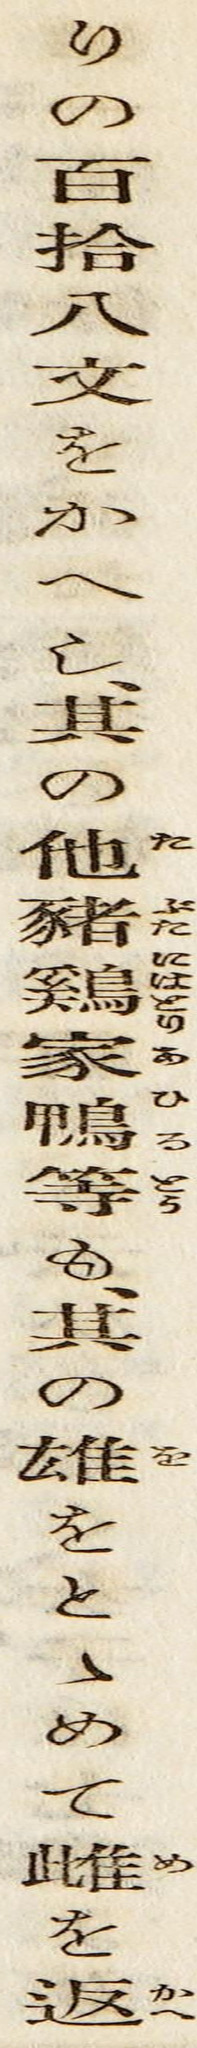りの百拾八文をかへし、其の他猪鶏家鴨等も、其の雄をとゝめて雌を返
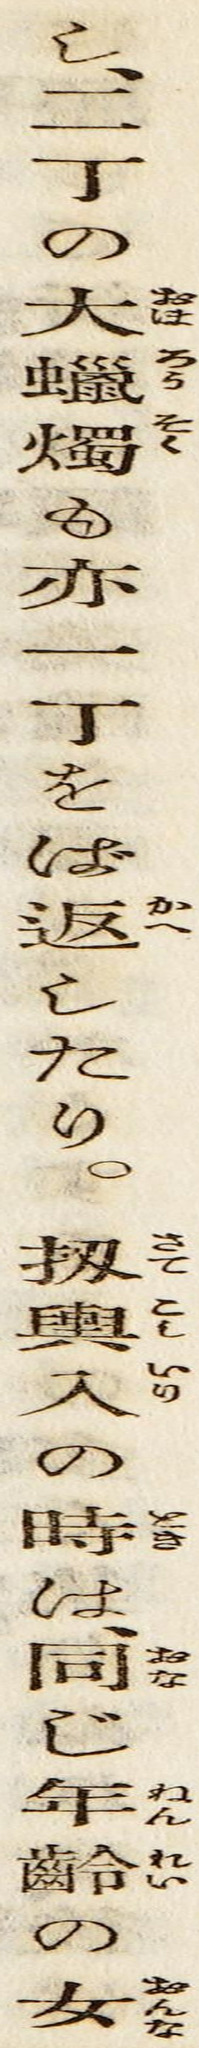し、二丁の大蝋燭も亦一丁をば返したり。扨輿入の時は、同じ年齢の女
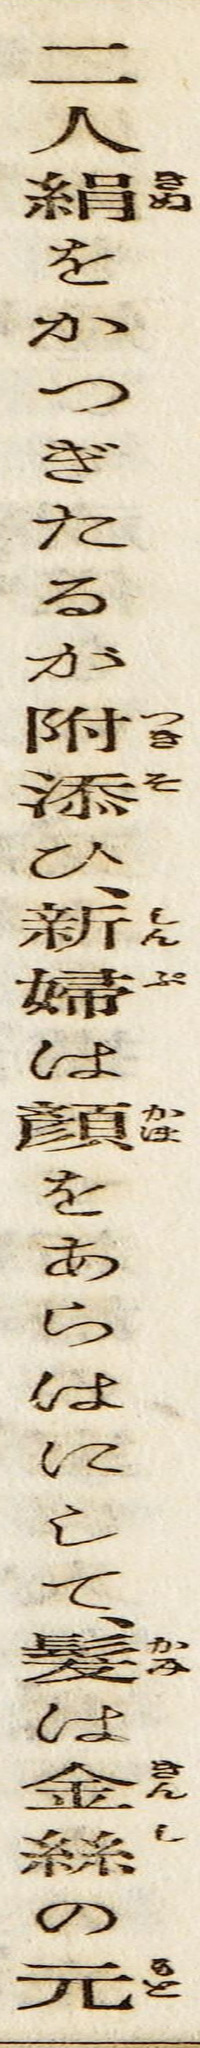二人絹をかつぎたるが附添ひ、新婦は顔をあらはにして、髪は金糸の元
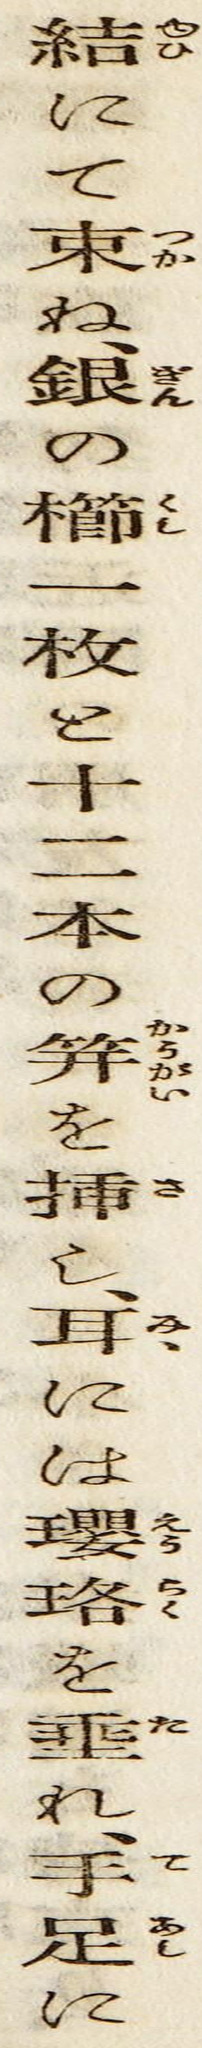結にて束ね、銀の櫛一枚と十二本の笄を挿し、耳には瓔珞を垂れ、手足に
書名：日本漂流譚
